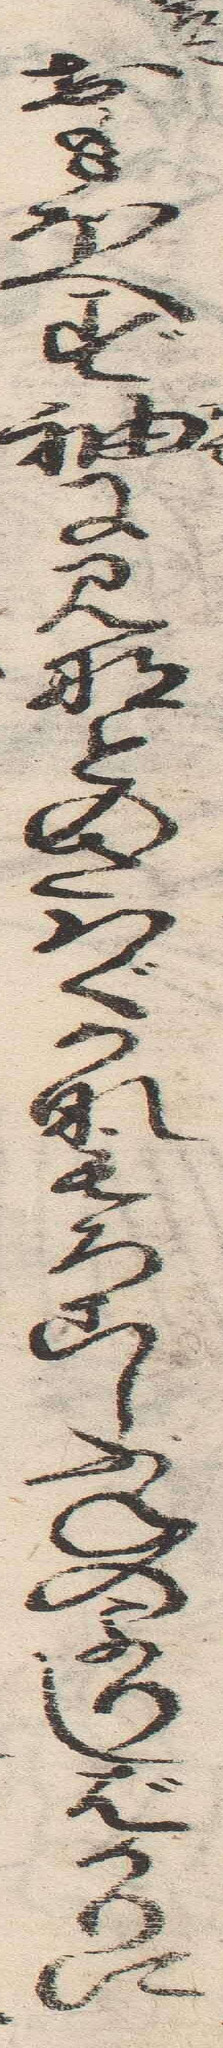新古今おもほへず袖にみなとのさはぐかなもろこしふねのよりしばかりに
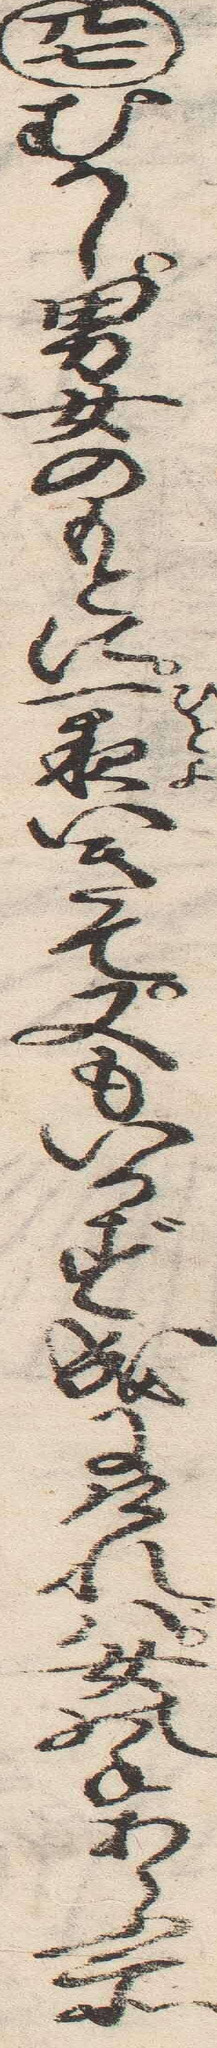廿七むかし。男女のもとに。一夜いきて。又もいかいかず成にければ。女の手あらふ所
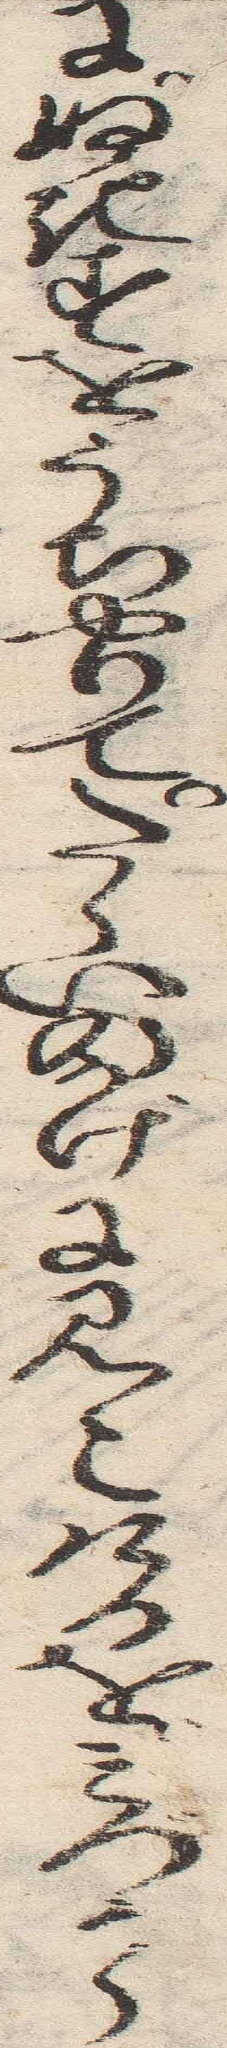に。ぬきすをうちやりて。たらいのかげに見えけるをみづから
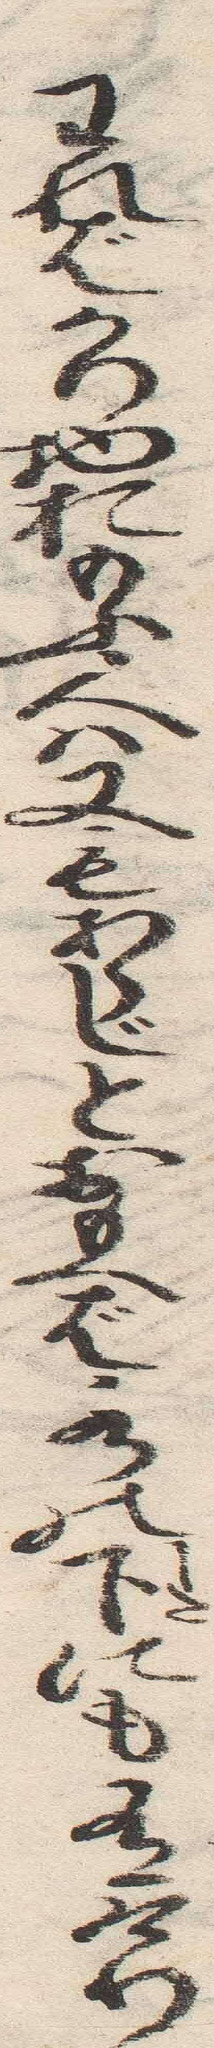わればかり物おもふ人は又もあらじとおもへば水の下にも有けり
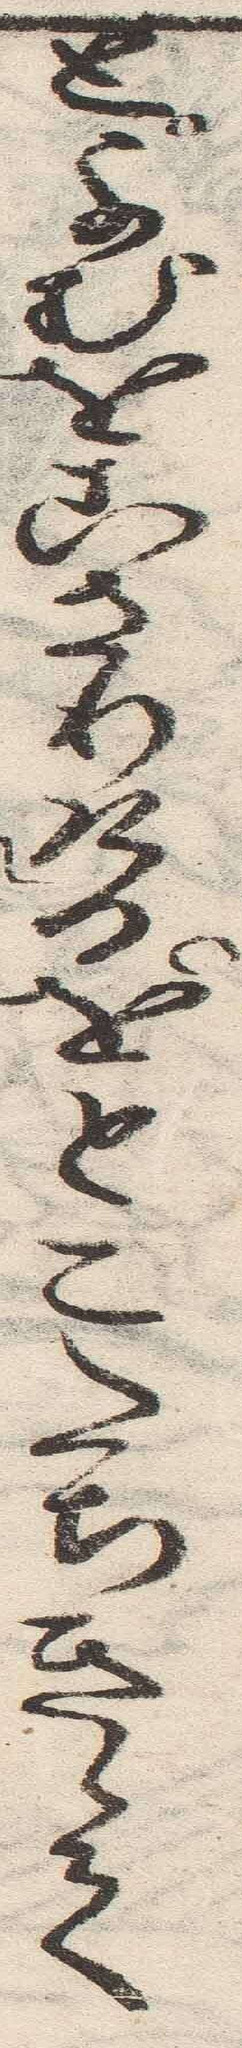と。よむをこさりける。をとこたちきゝて
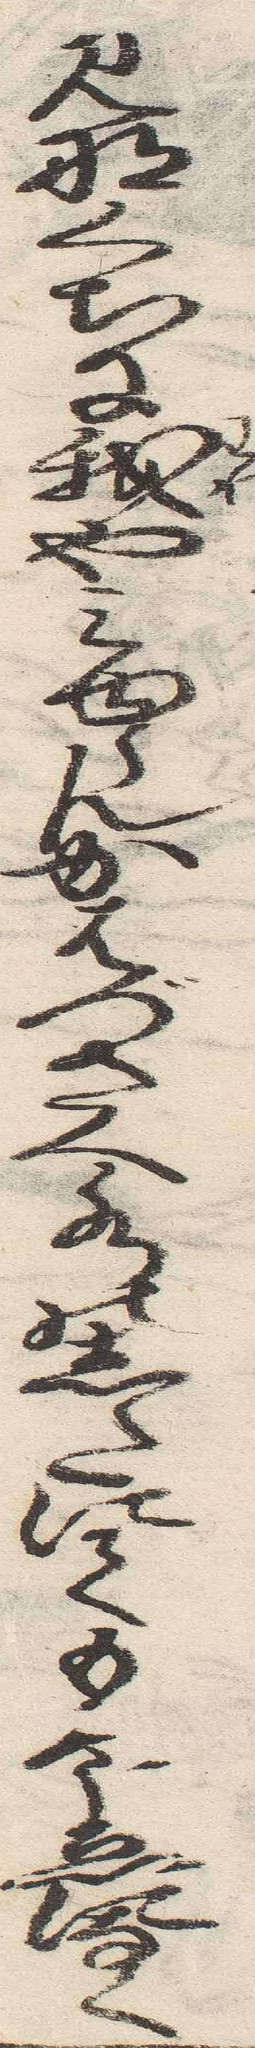みなくちに我やみゆらんかはづさへ水のしたにてもろこゑになく
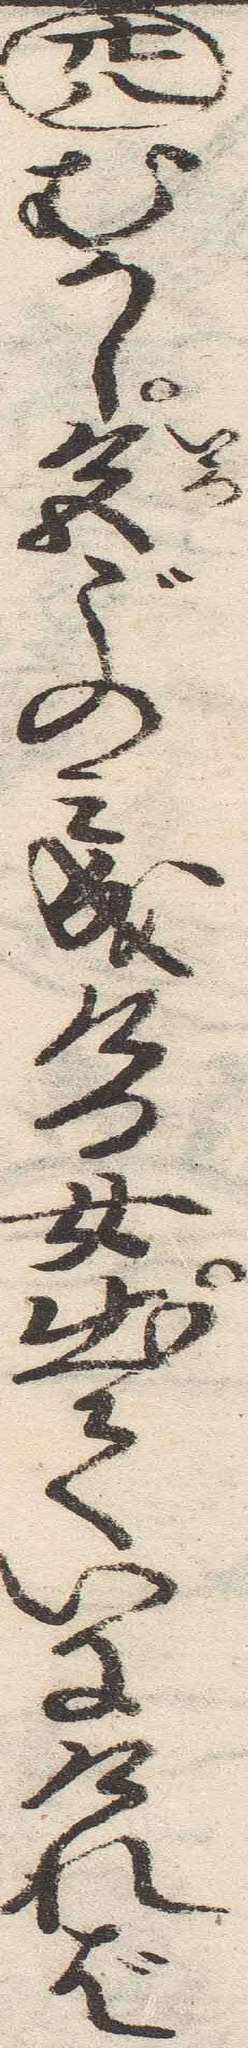廿八むかし。色ごのみ成ける女。出ていにければ
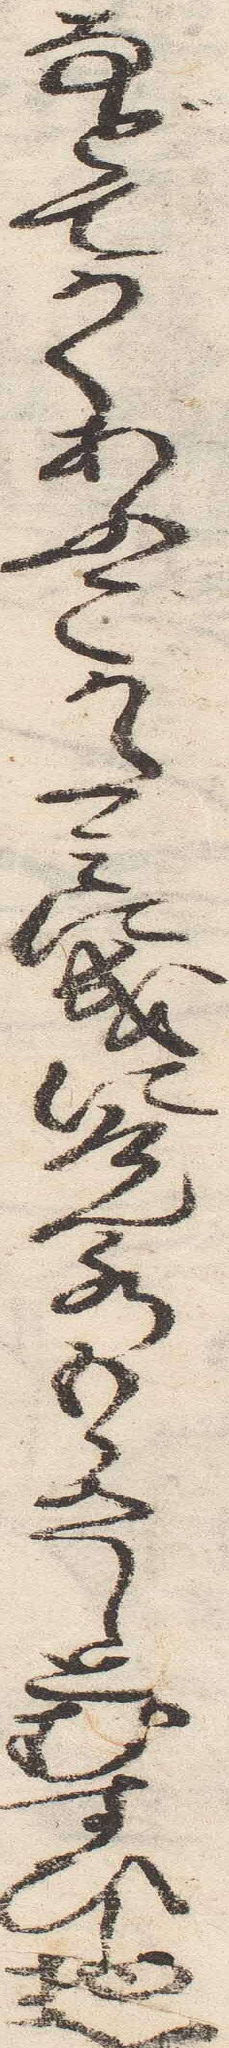などてかくあふこかたみに成にけん水もらさしとむすひし物を
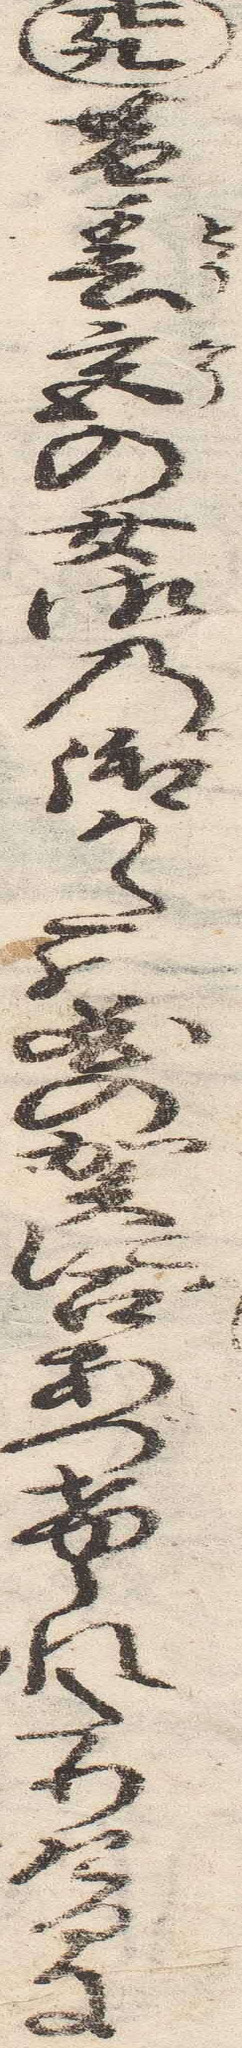廿九昔春宮の女御の御かたの花の賀に召あづけられたりけるに
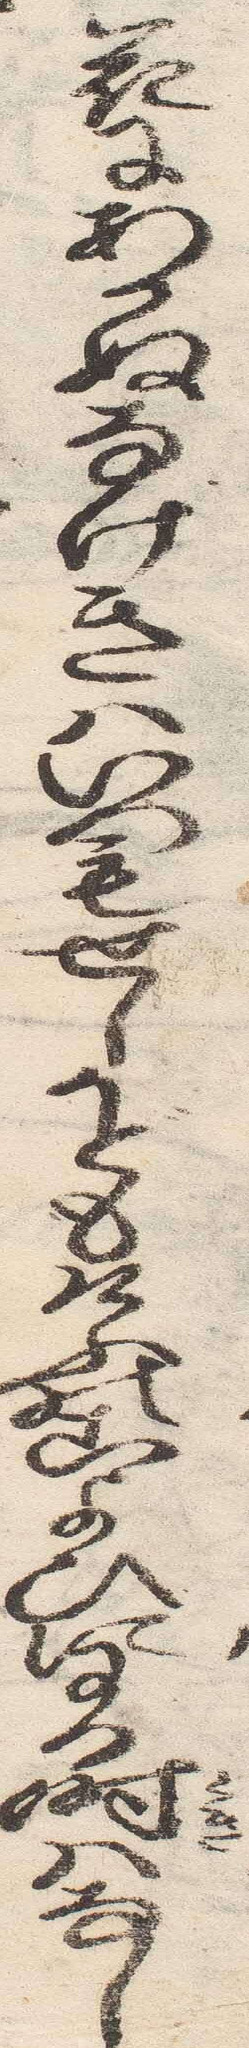花にあかぬなけきはいつもせしかどもけふのこよひににる時はなし
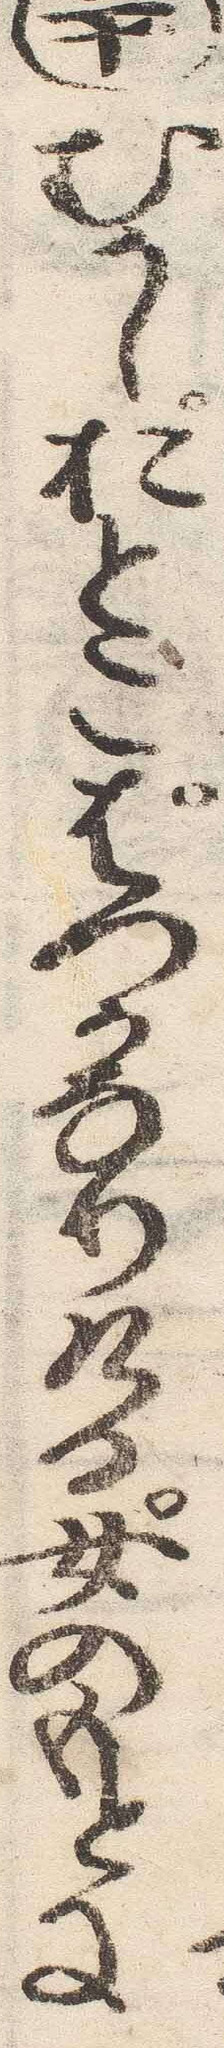三十むかし。おとこ。はつかなりける。女のもとに
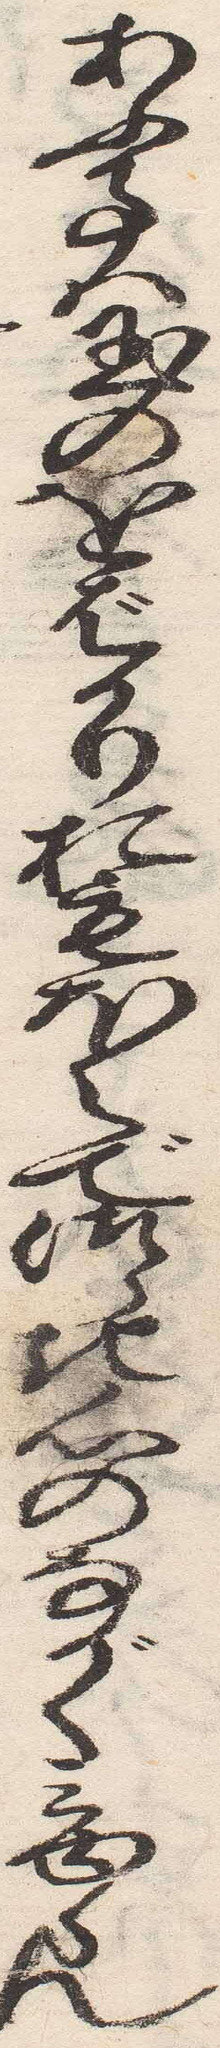あふ事は玉のをばかりおもほえでつらき心のながくみゆらん
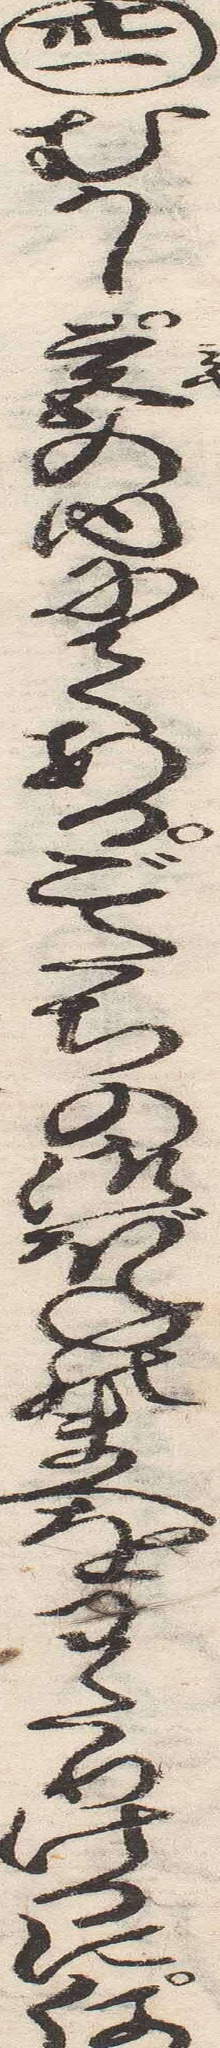卅一むかし。宮の内にてある。ごたちのつぼねのまへをわたりけるに。何
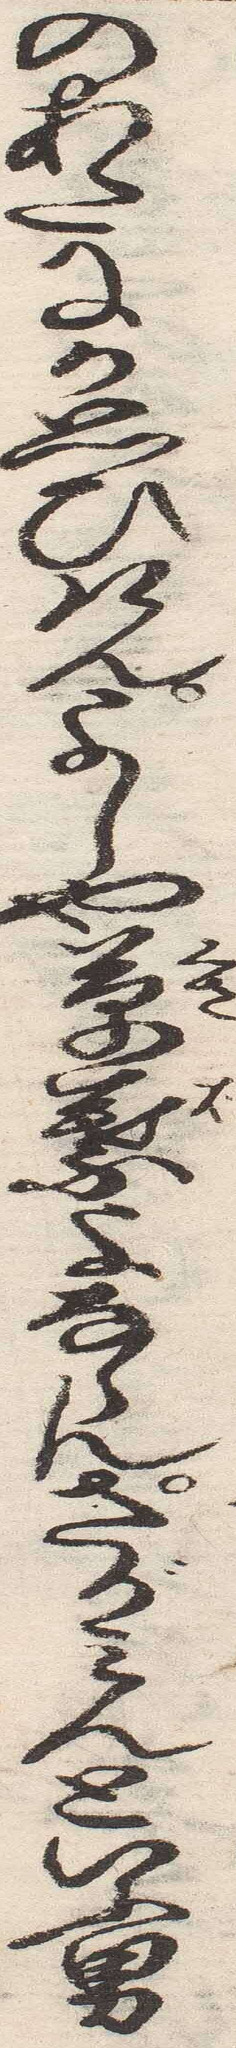のあたにか思ひけん。よしや草葉よならん。さがみんといふ男
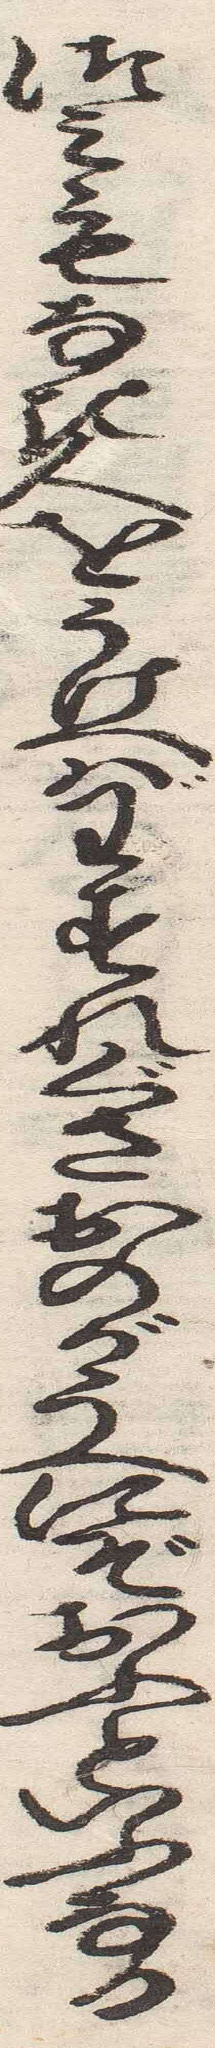つみもなき人をうけへばわすれぐさおのがうへにぞおふといふなる
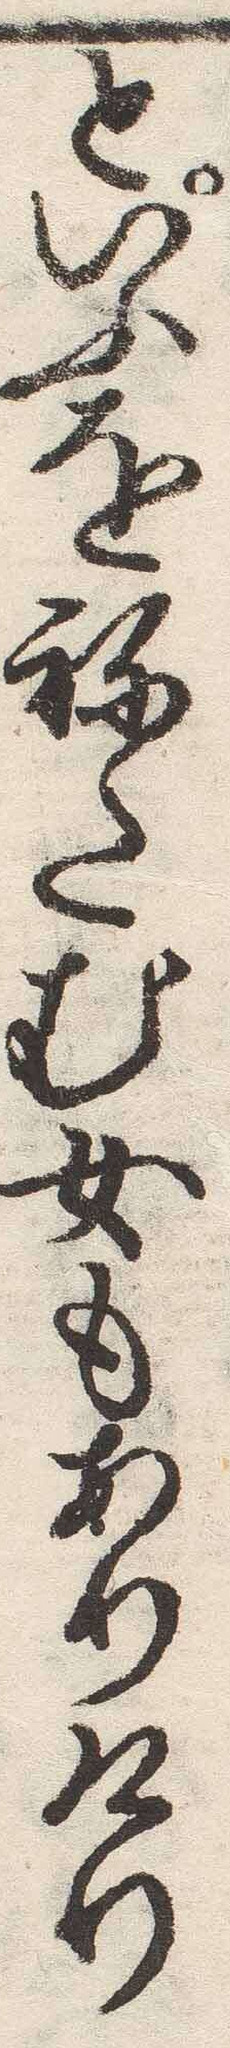と。いふをねたむ女もありけり
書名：伊勢物語
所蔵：東京学芸大学附属図書館 国文学研究資料館
